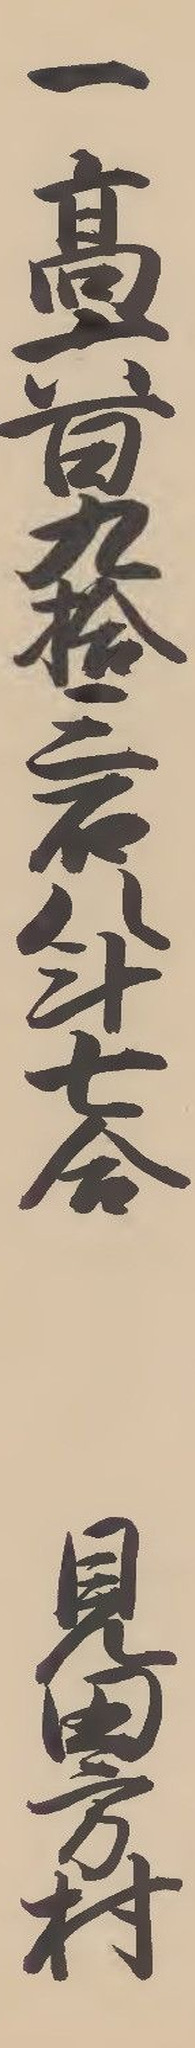一高六百九拾三石八斗七合見田方村

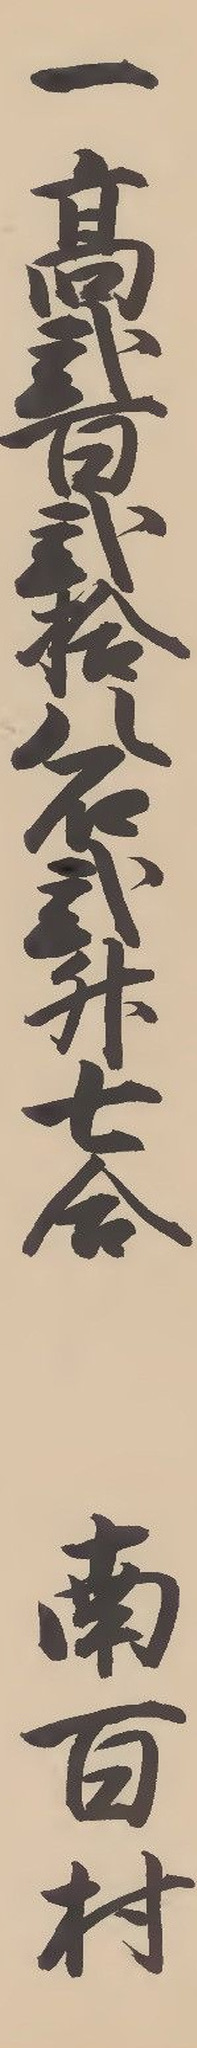一高弐百弐拾八名弐升七合南百村
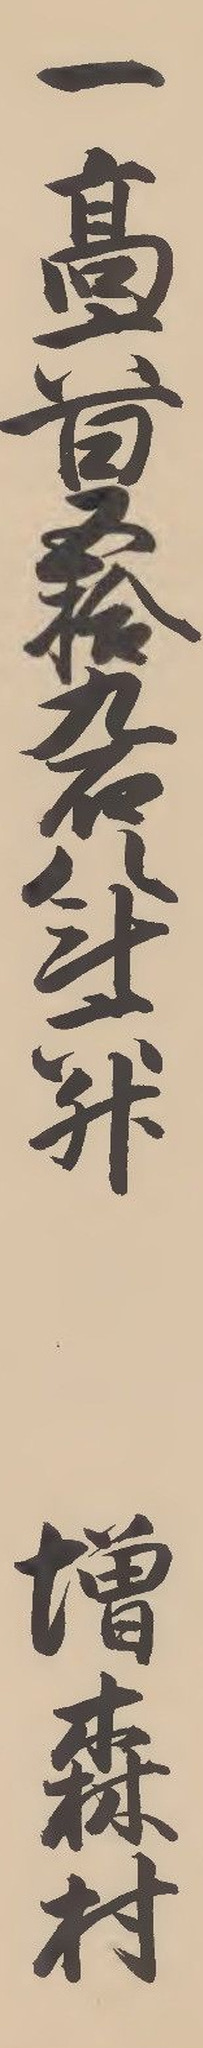一高六百五拾九石八斗六升増森村
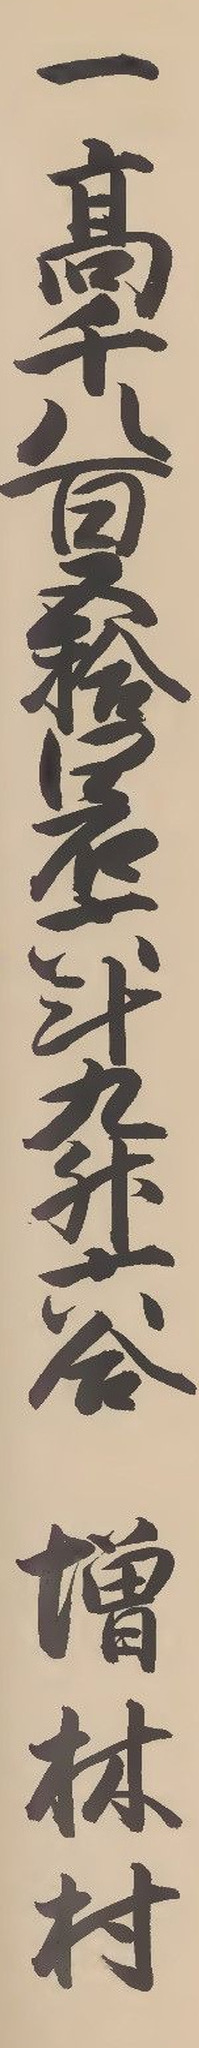一高千八百五拾四石六斗九升六合増林村
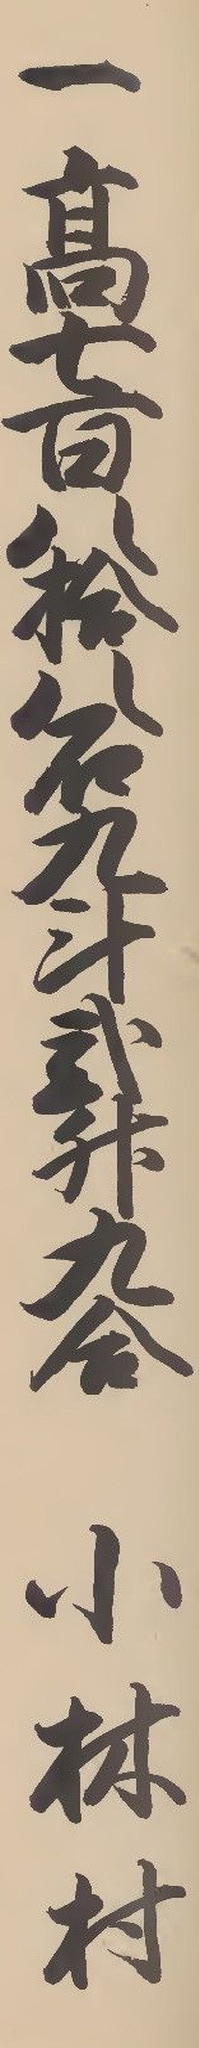一高七百八拾八石九斗弐升九合小林村
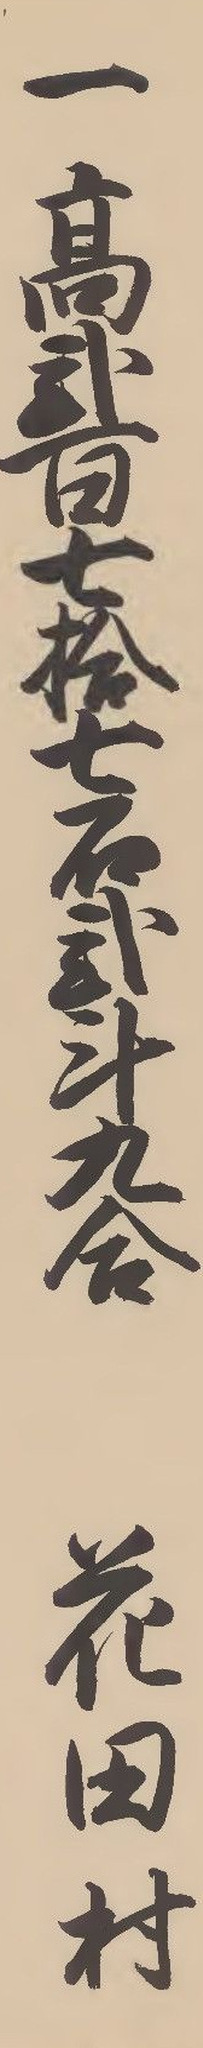一高弐百七拾七石弐斗九合花田村
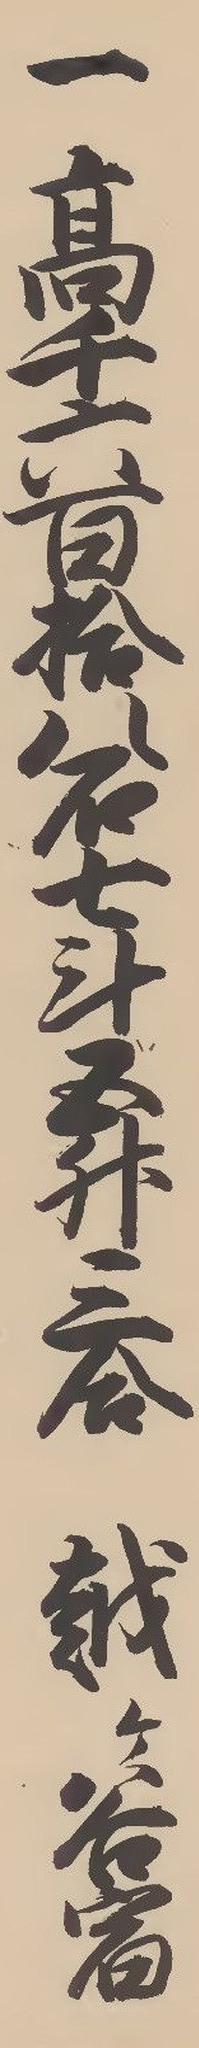一高千六百拾八石七斗五升三合越ヶ谷宿
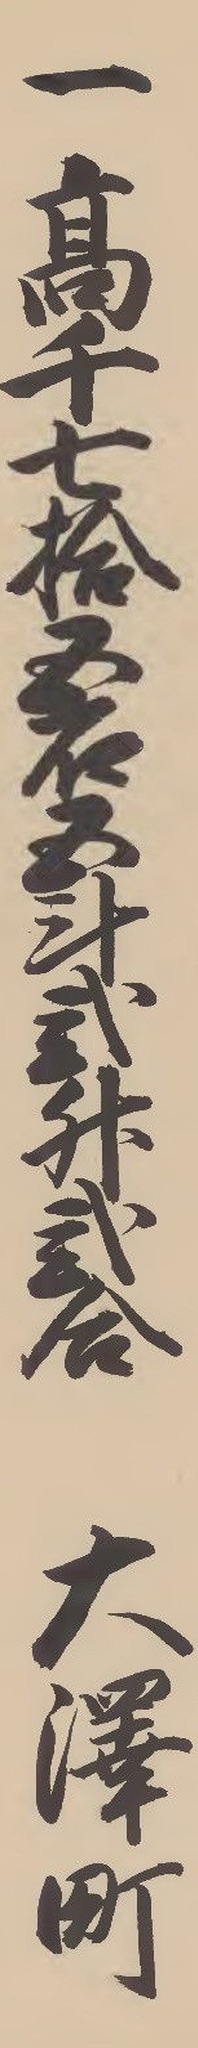一高千七拾五石五斗弐升弐合大澤町

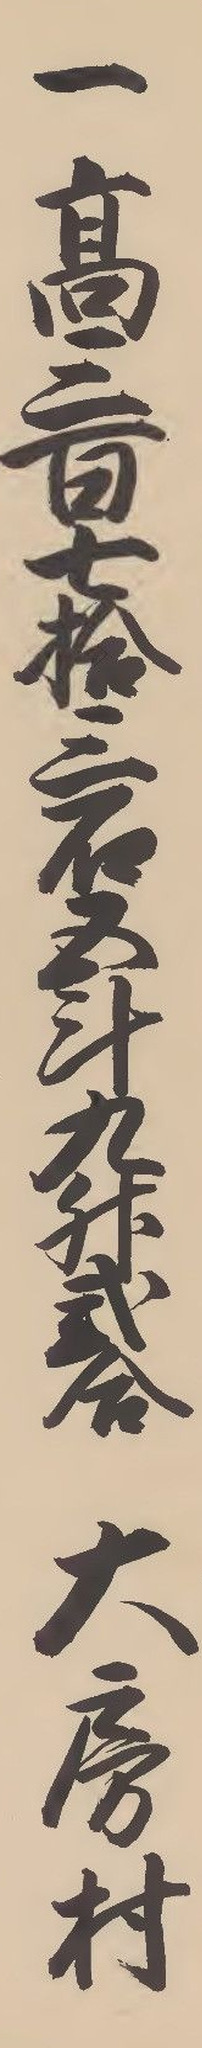一高三百七拾三石五斗九升弐合大房村
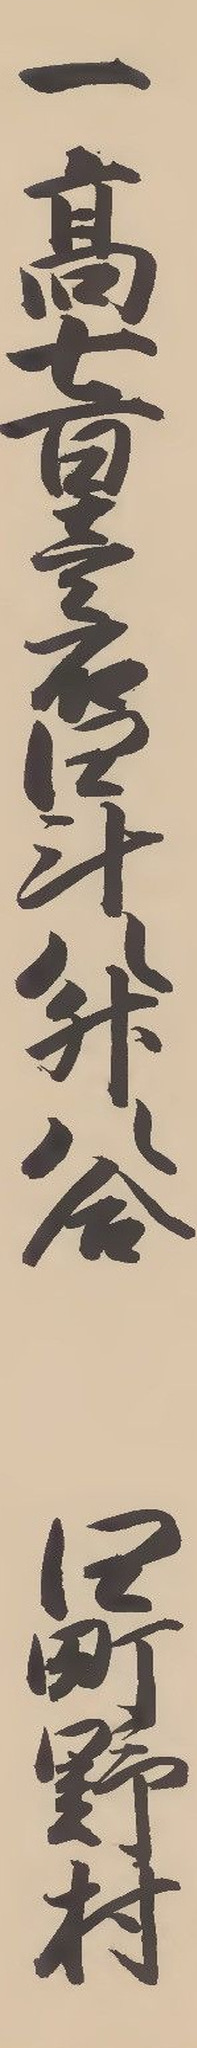一高七百壱石四斗八升八合四町野村
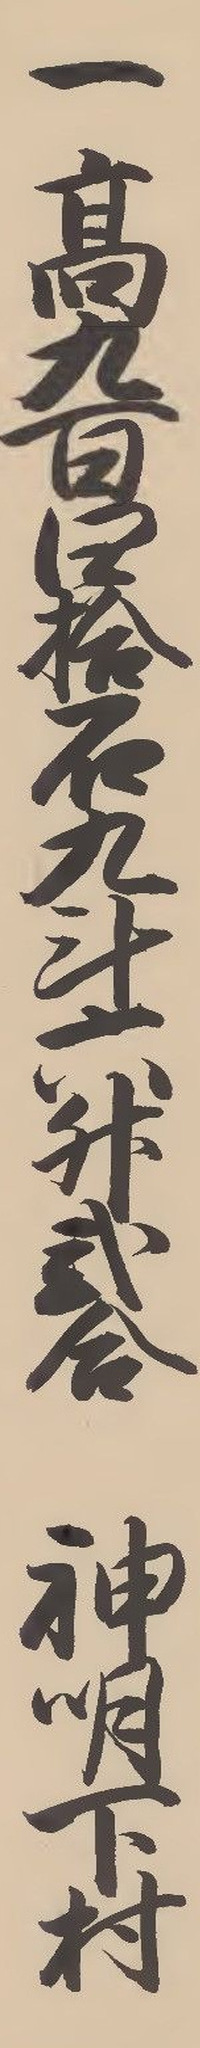一高九百四拾石九斗六升弐合神明下村
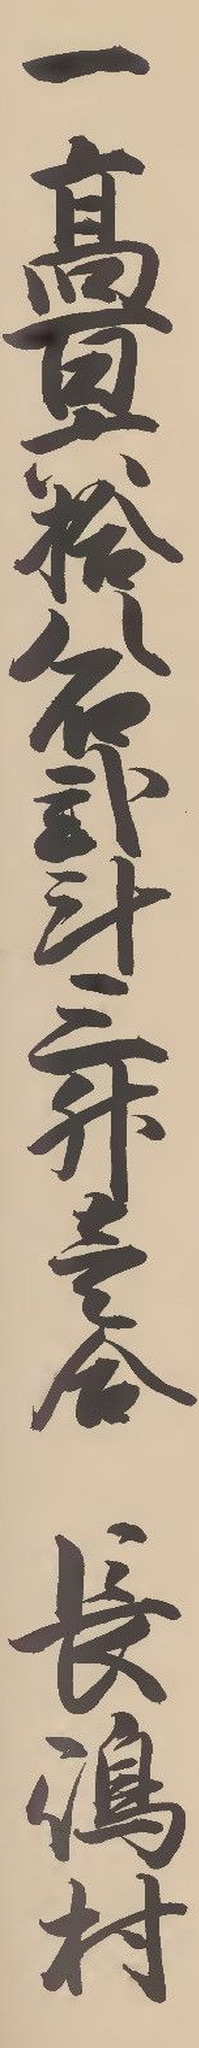一高百六拾八石弐斗三升壱合長嶋村
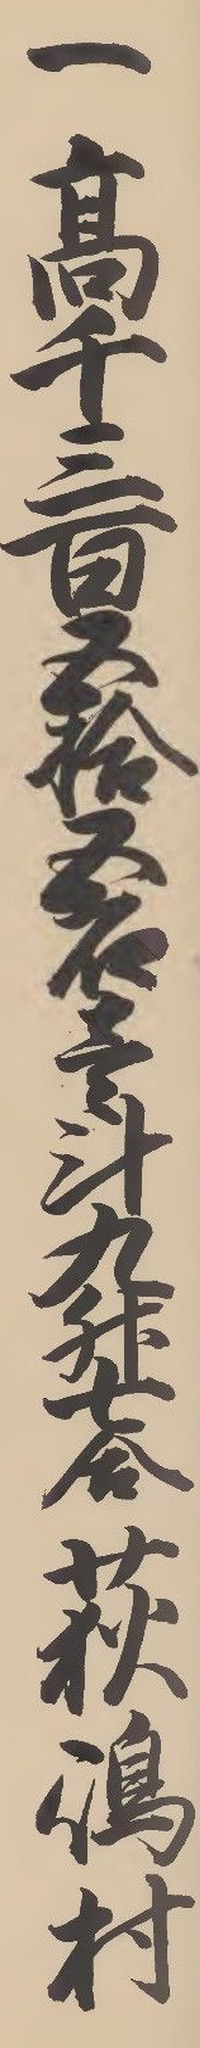一高千三百五拾五石壱斗九升七合荻嶋村
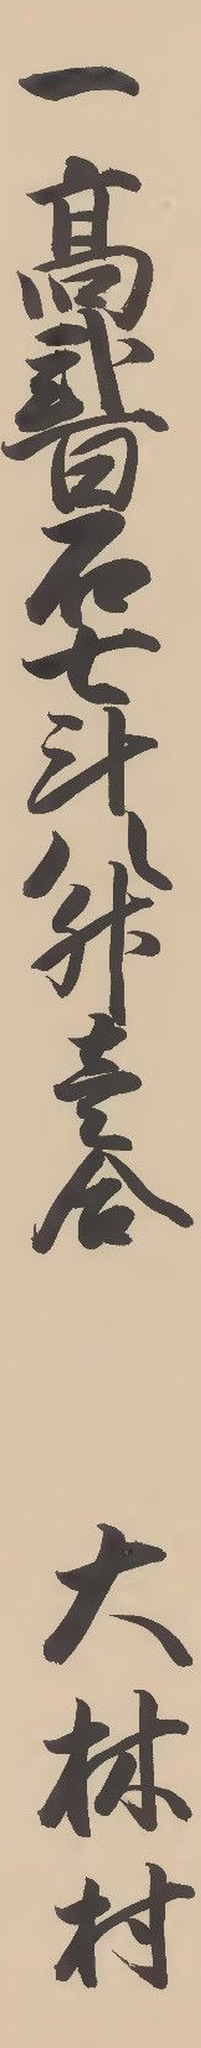一高弐百石七斗八升壱合大林村
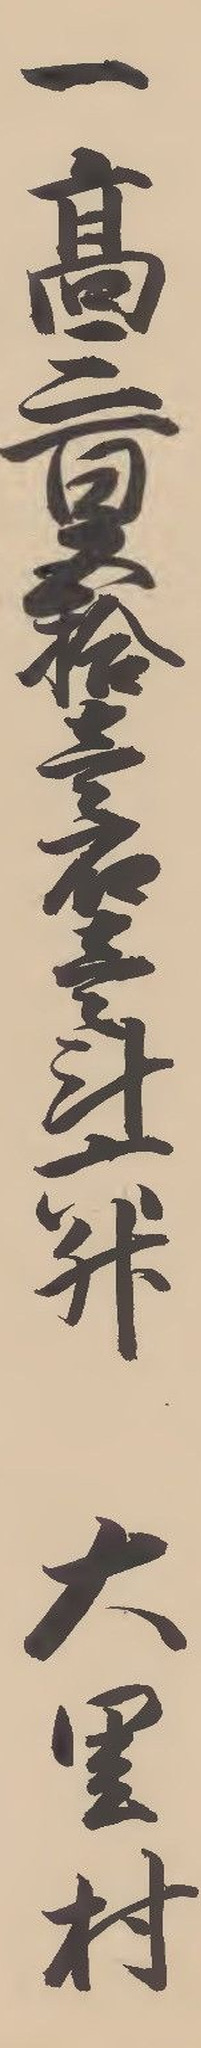一高三百五拾壱石壱斗六升大里村
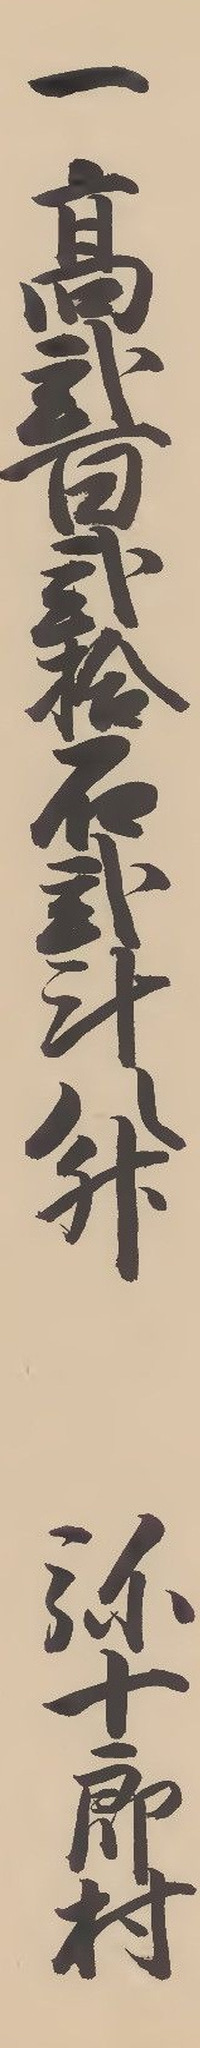一高弐百弐拾石弐斗八升弥十郎村
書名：武蔵国郷帳　下
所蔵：国立公文書館 National Archives of Japan
